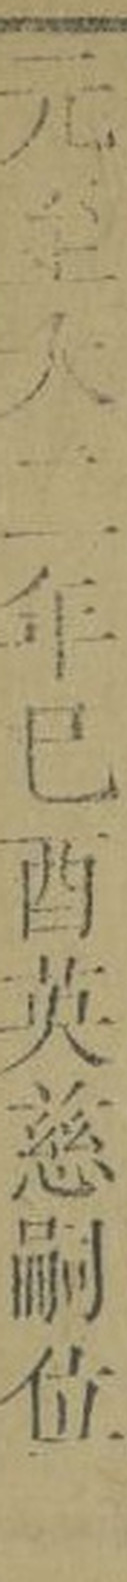元至大二年巳酉英慈嗣位
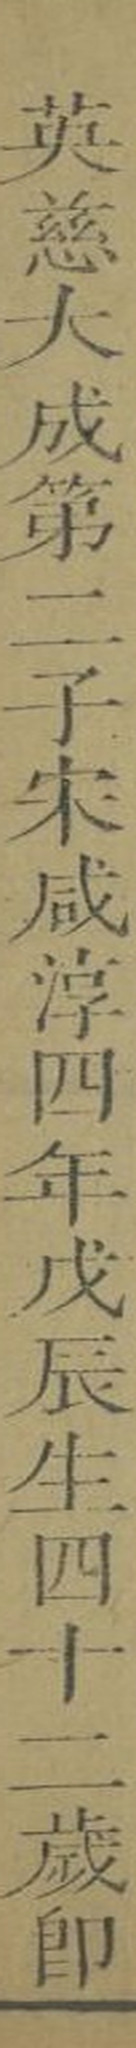英慈大成第二子宋咸淳四年戊辰生四十二歳即
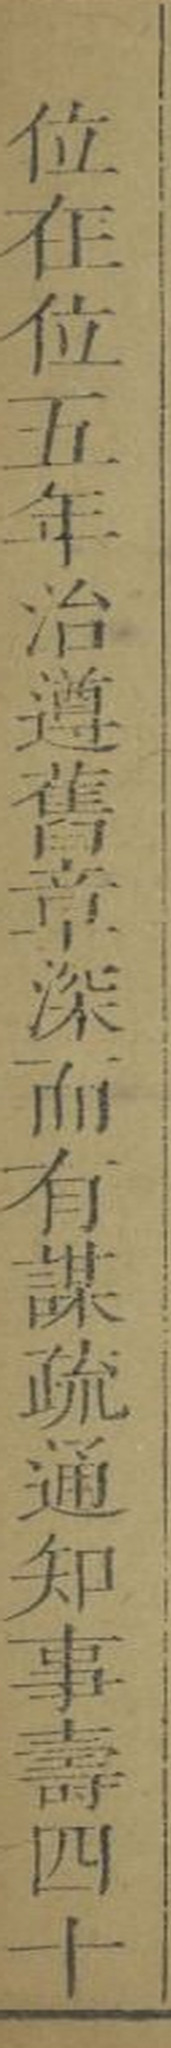位在位五年治遵旧章深而有謀疏通知事寿四十

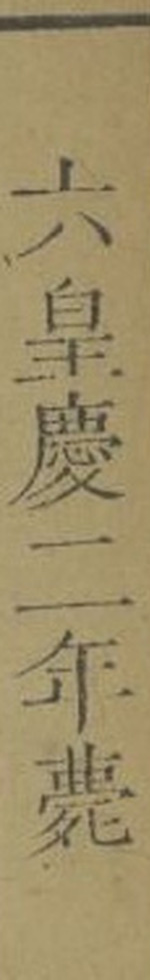六皇慶二年薨
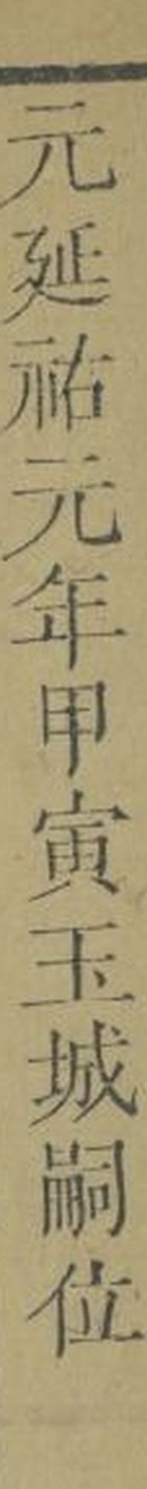元延祐元年甲寅玉城嗣位
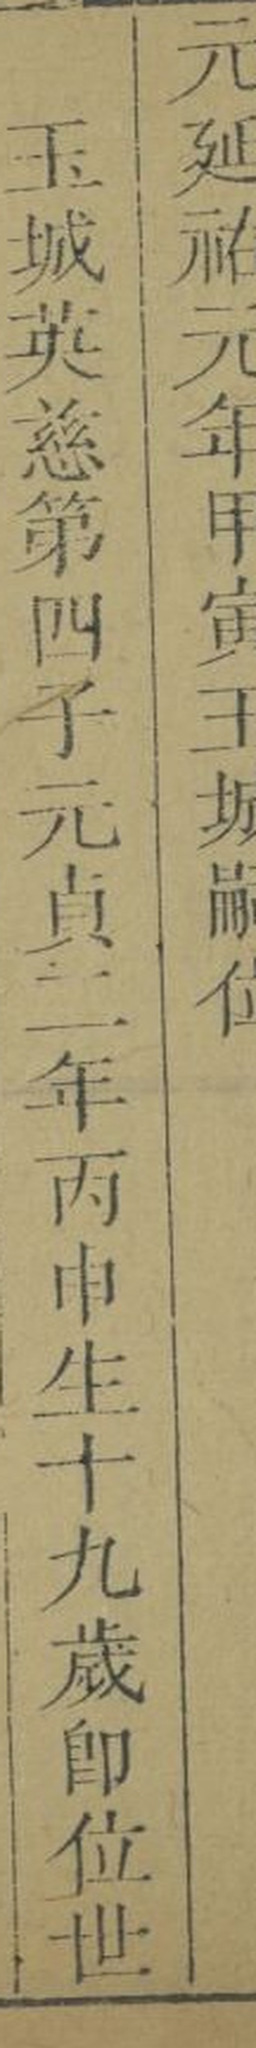玉城英慈第四子元貞二年丙申生十九歳即位世
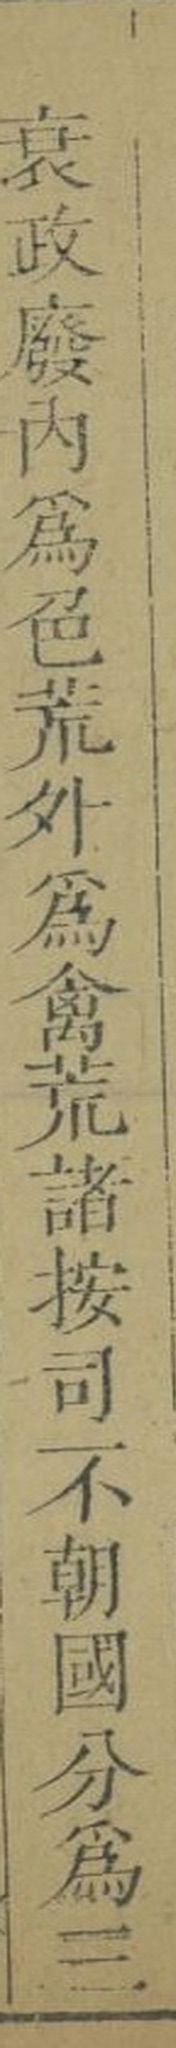衰政廃内為色荒外為禽荒諸按司不朝国分為三
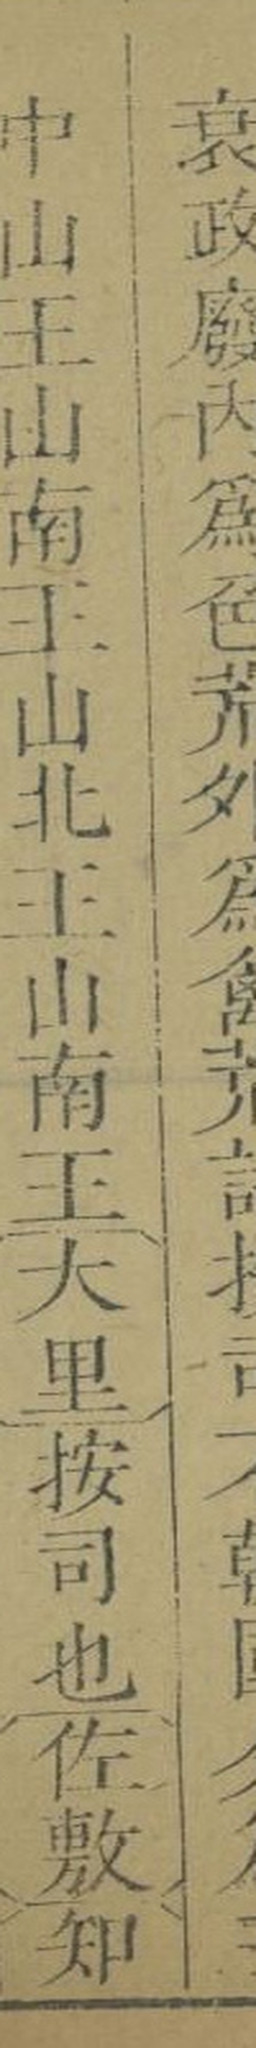中山王山南王山北王山南王[大里]按司也[佐敷][知
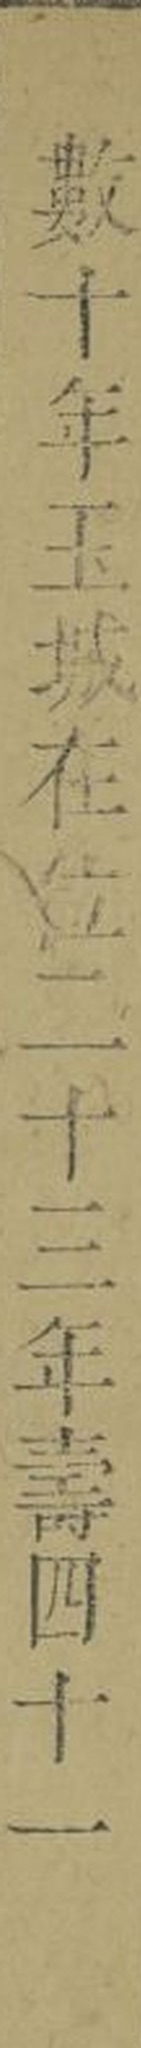数十年玉城在位二十三年寿四十一
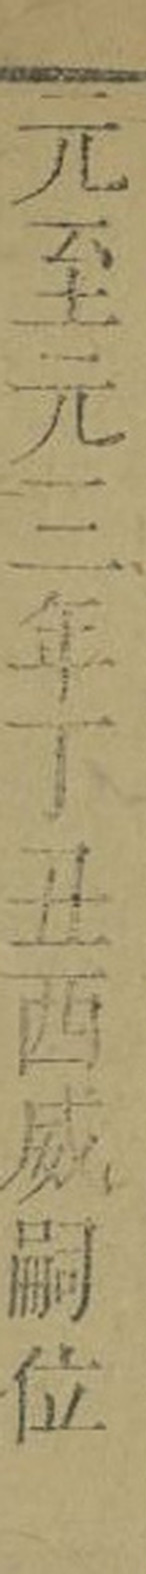元至元三年丁丑西威嗣位
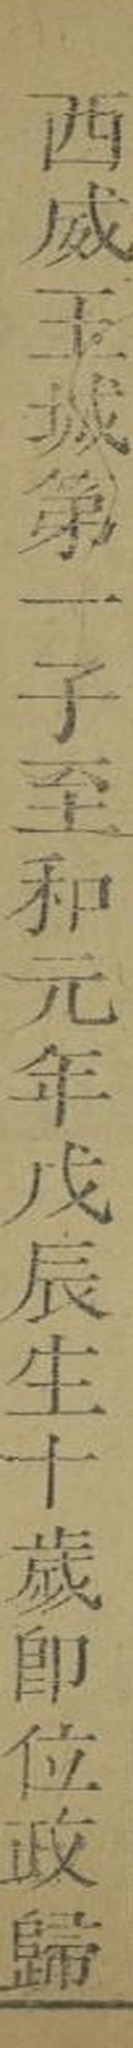西威玉城第一子至和元年戊辰生十歳即位政帰
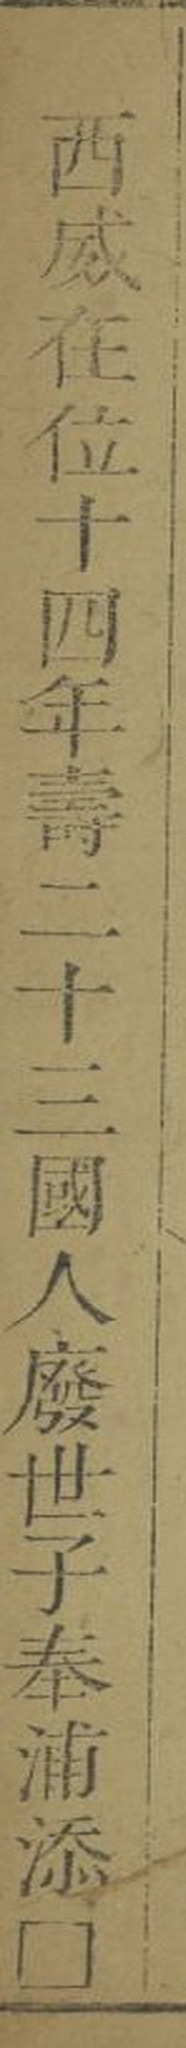西威在位十四年寿二十三国人廃世子奉浦添▢

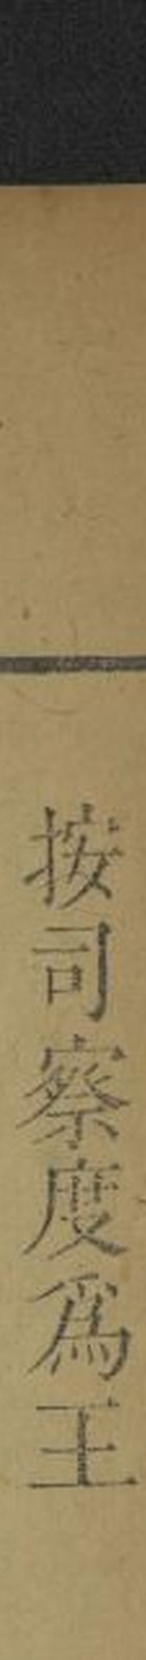按司察度為王
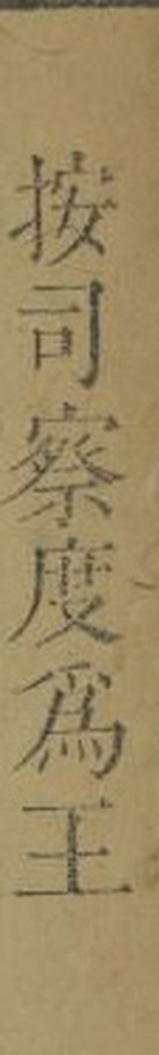按司察度為王
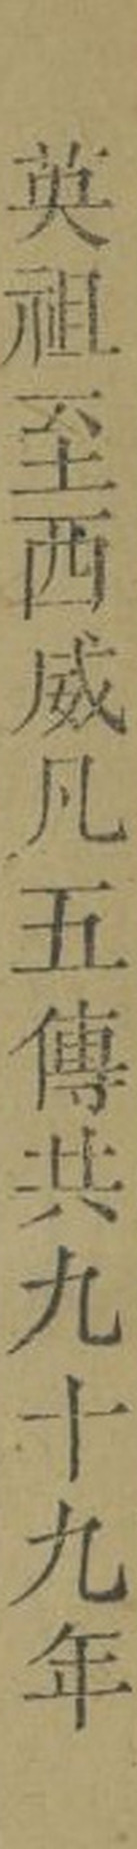英祖至西威凡五伝共九十九年
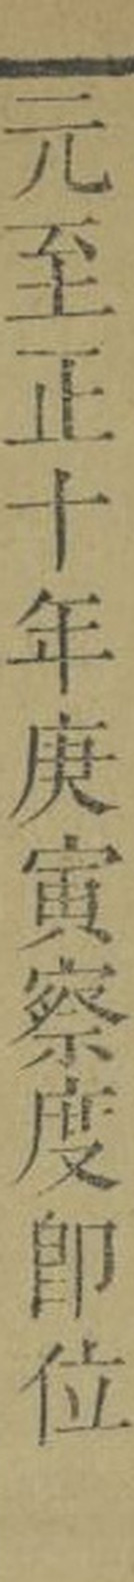元至正十年庚寅察度即位
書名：中山伝信録 巻三
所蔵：University of the Ryukyus Library
